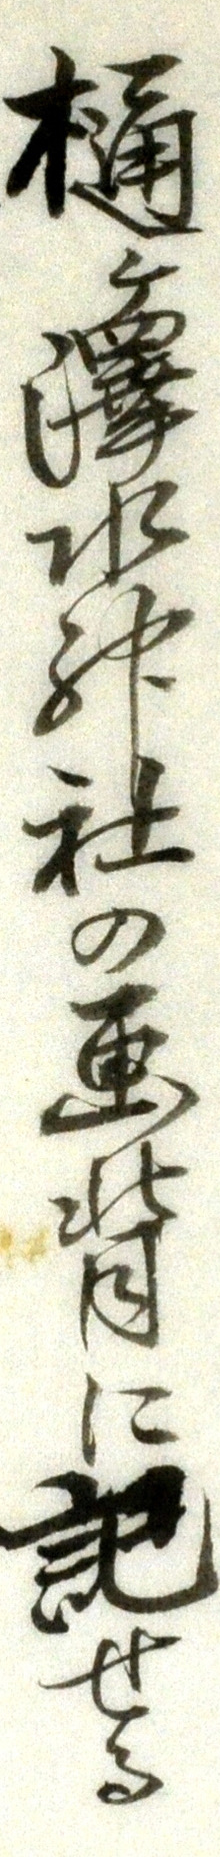桶ケ沢水神社の画背に記せる
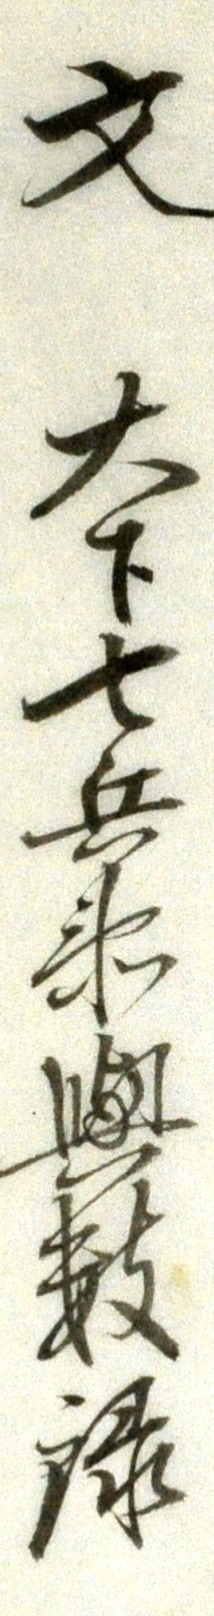文大下七兵衛与数録
